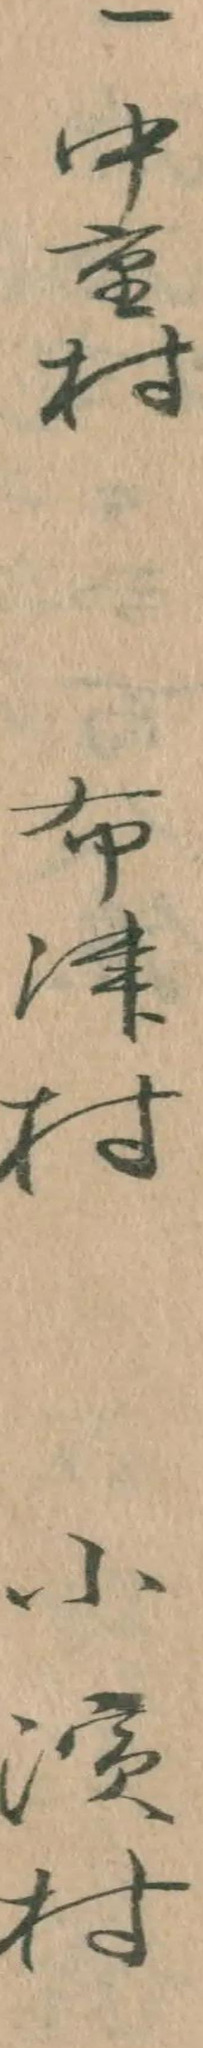一中重村布津村小浜村
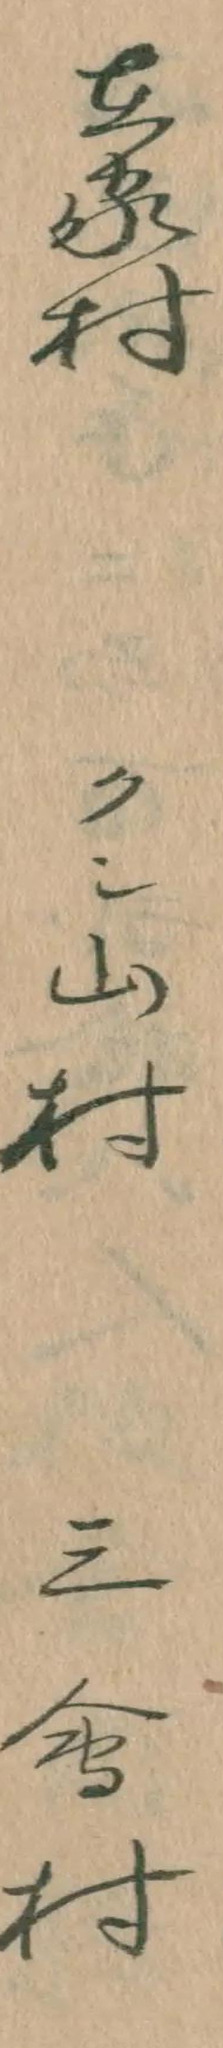在家村くし山村三会村
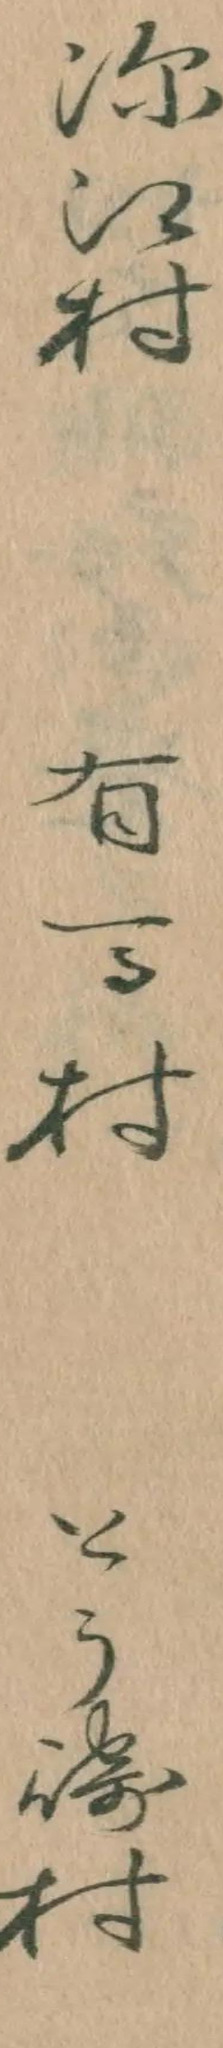深江村有馬村とう崎村
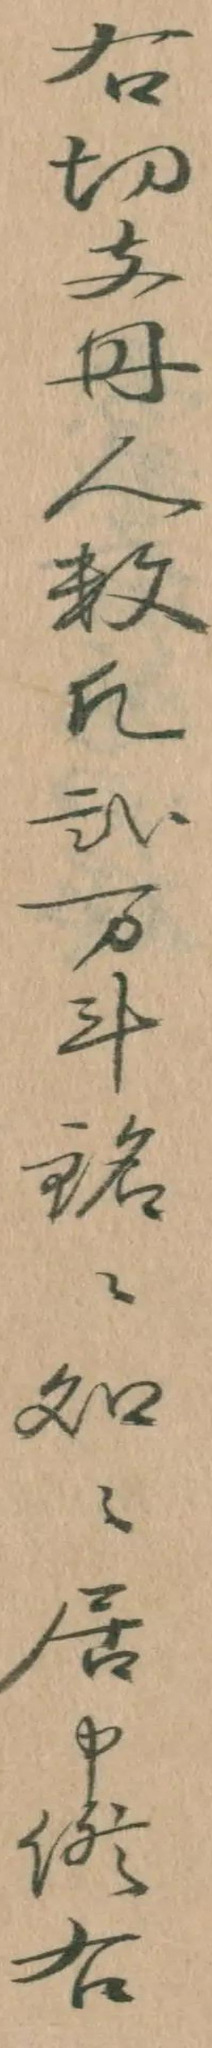右切支丹人数凡弐万斗銘々処々居申候右
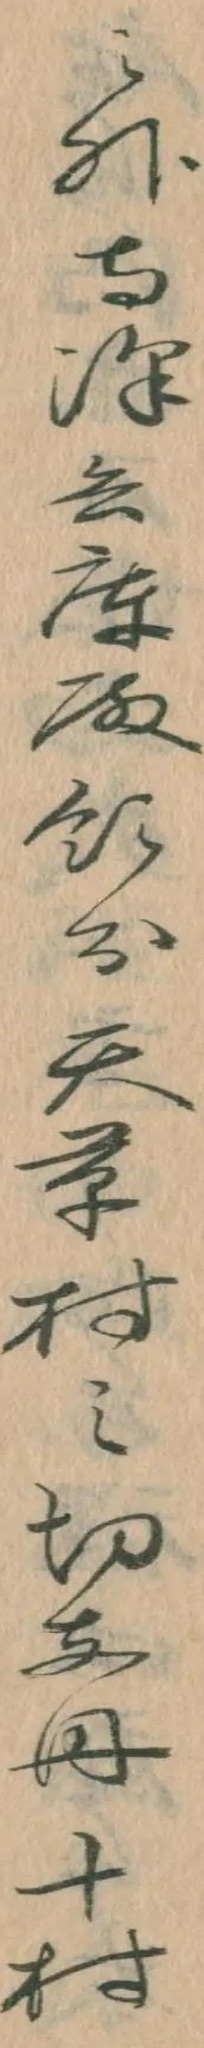之外寺沢兵庫殿領分天草村之切支丹十村
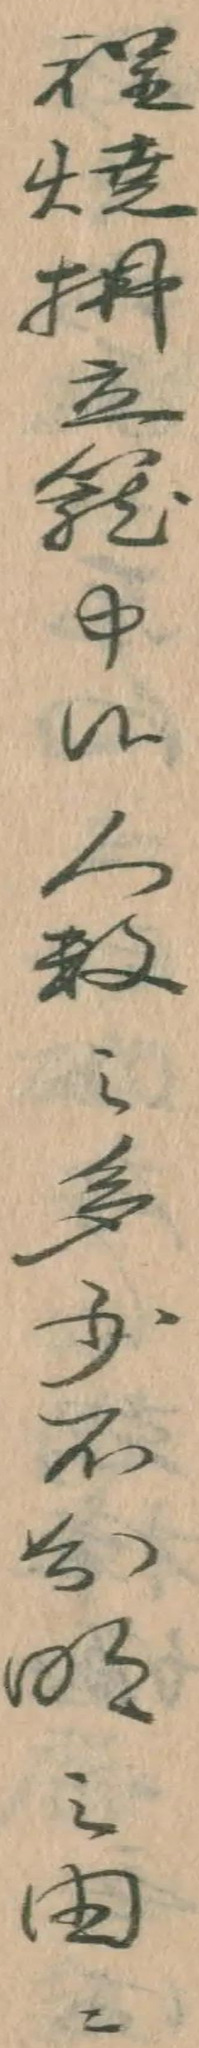程焼払立籠申候人数之多少不分明之由に
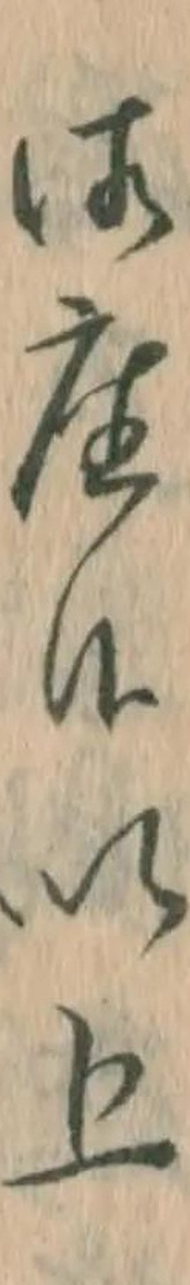御座候以上
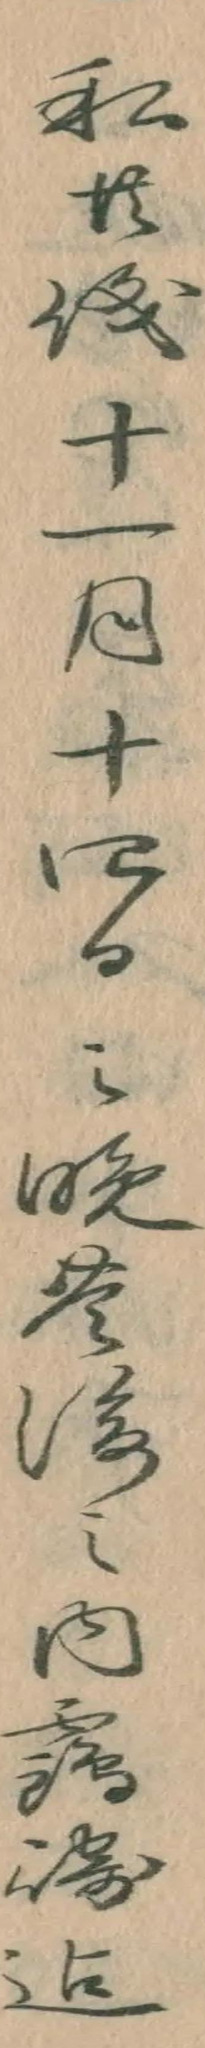一私共儀十一月十四日之晩豊後之内露崎迄
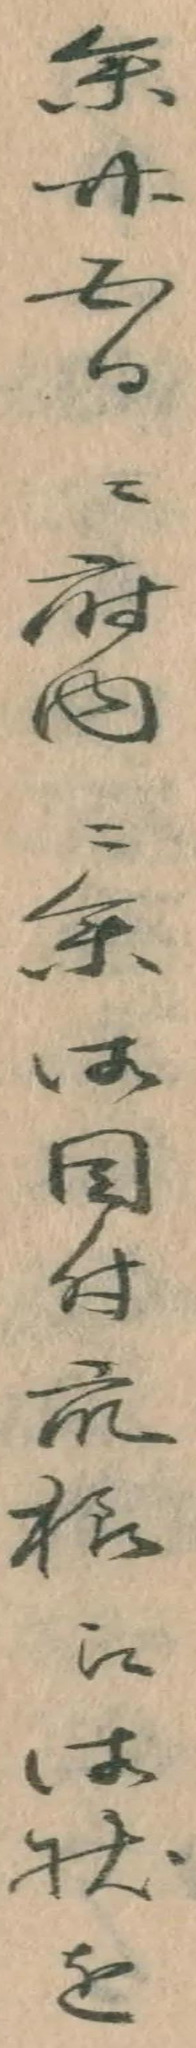参廿五日に府内に参御目付衆様江御状を
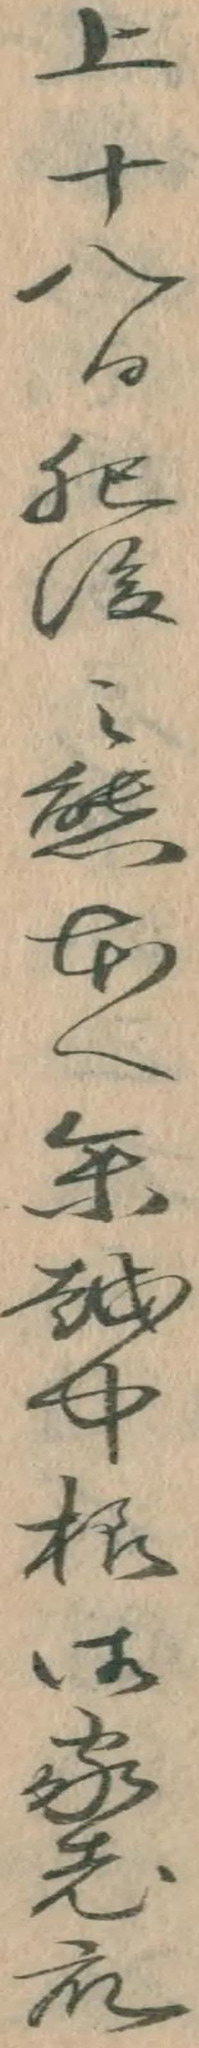上十八日肥後之熊本へ参越中様御家老衆
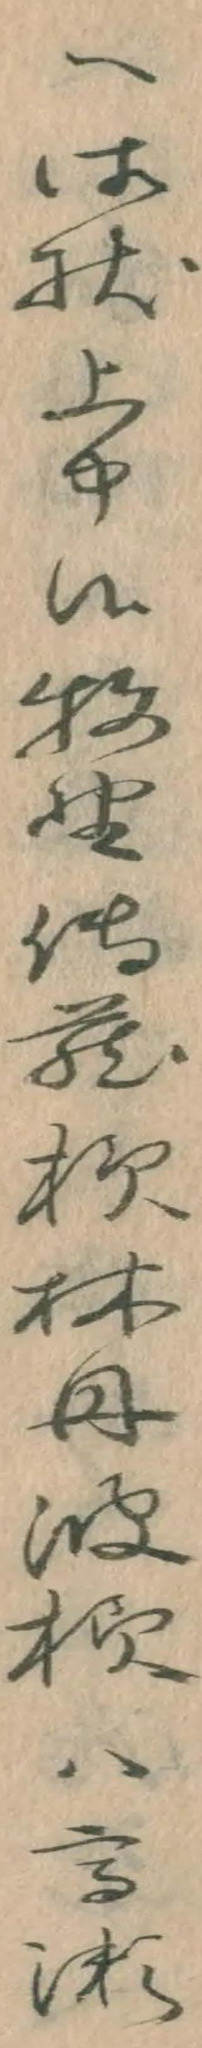へ御状上申候牧野伝蔵様林丹波様は高瀬
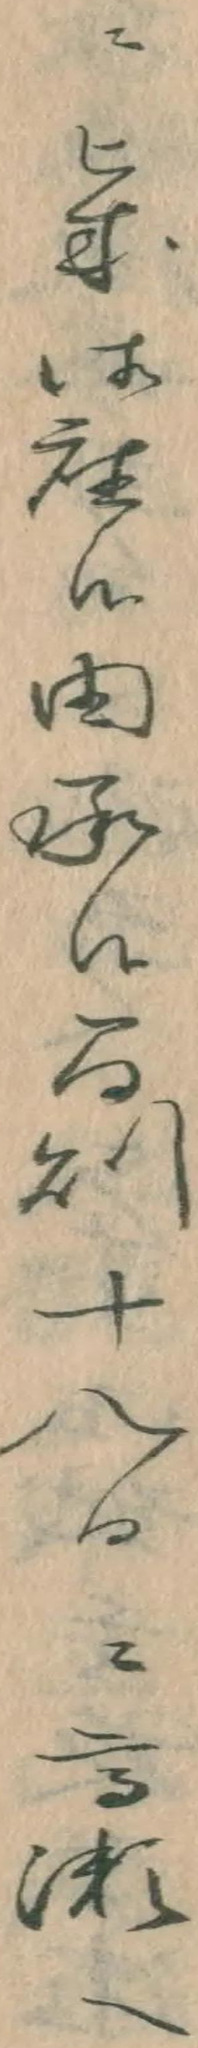に被成御座候由承候間則十八日に高瀬へ
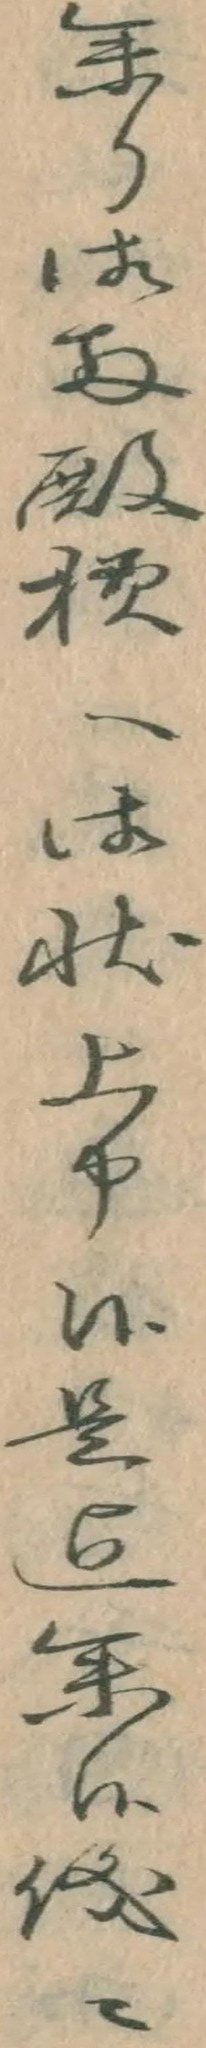参り御両殿様へ御状上申候是迄参候儀に
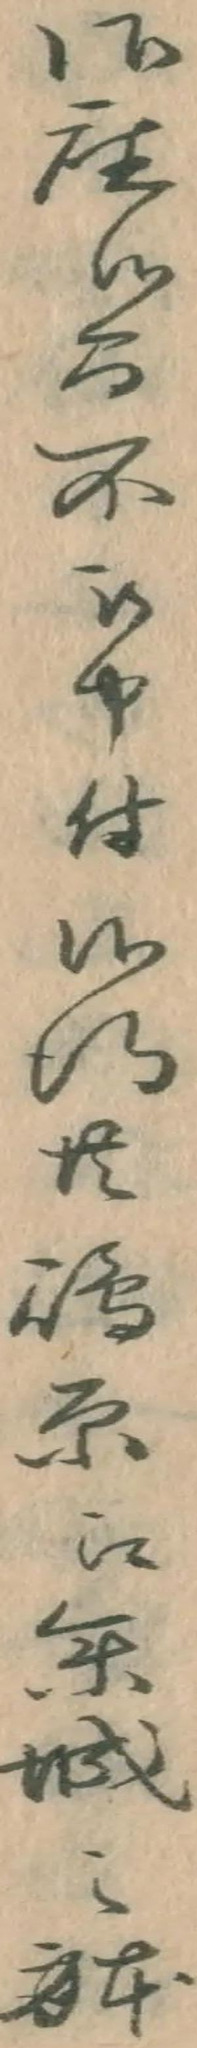御座候間不被申付候得共島原江参城之躰

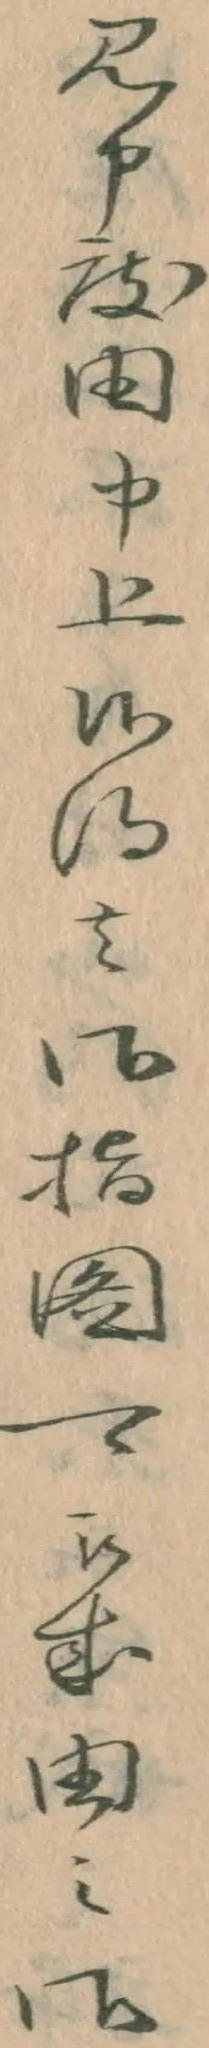見申度由申上候得者御指図可被成由之御
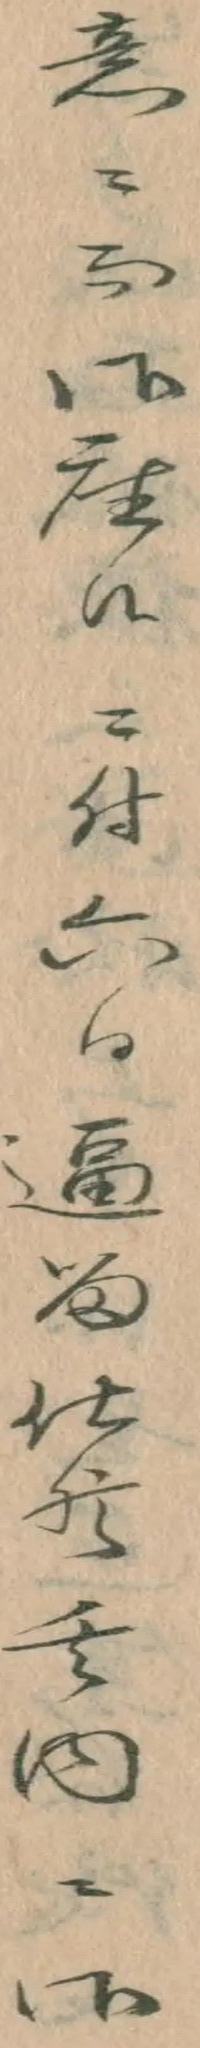意に而御座候に付六日逗留仕候其内に御
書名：切支丹御退治記 49巻. [4]
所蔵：国立国会図書館 National Diet Library, JAPAN
